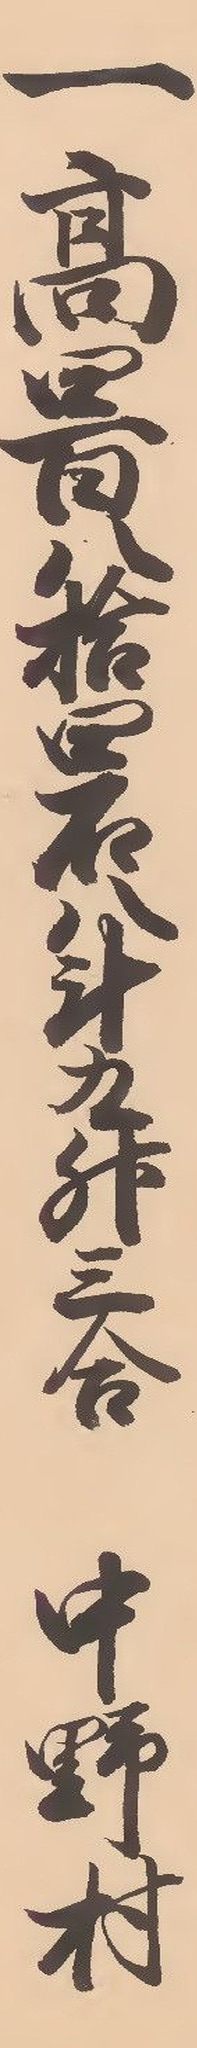一高四百八拾四石八斗九升三合中野村
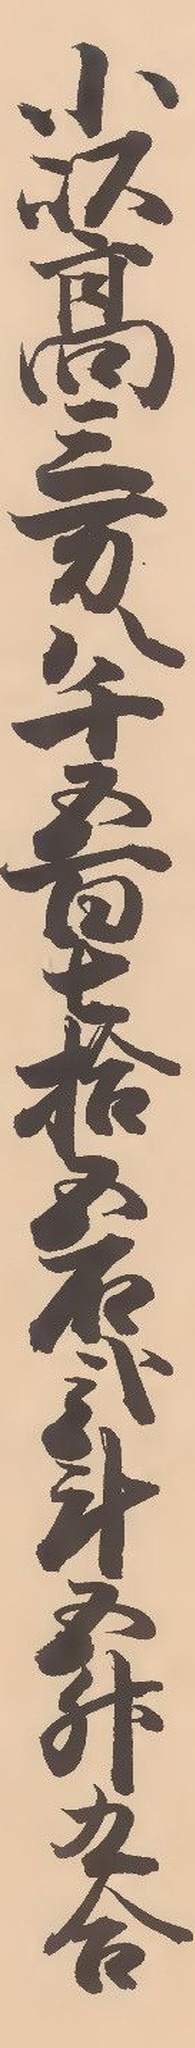小以高三万八千五百七拾五石弐斗五升九合

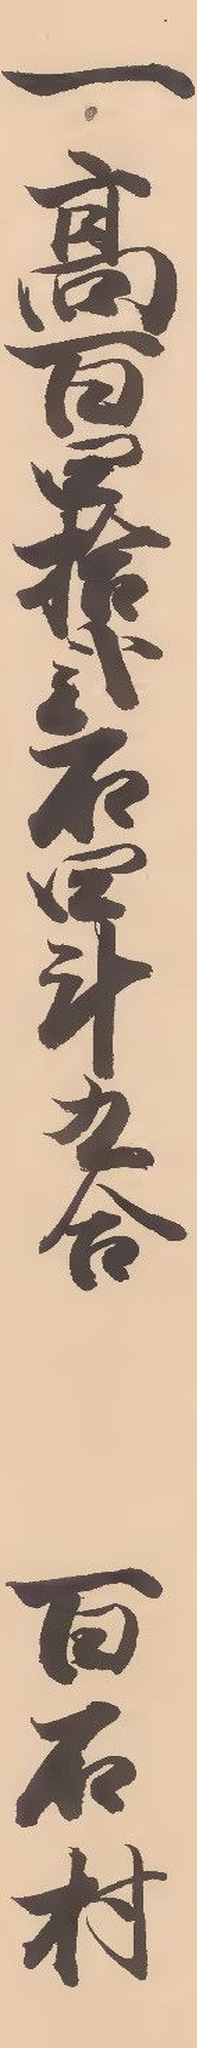一高百四拾弐石四斗九合百石村
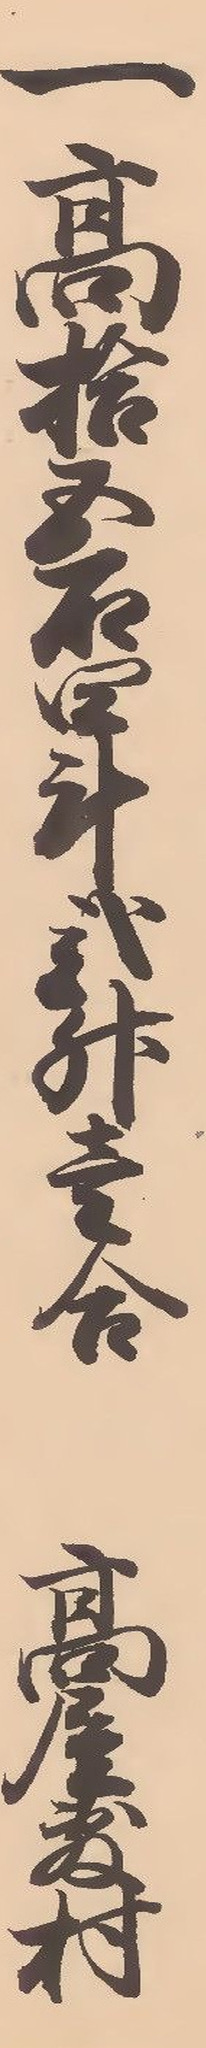一高拾五石四斗弐升壱合高屋敷村
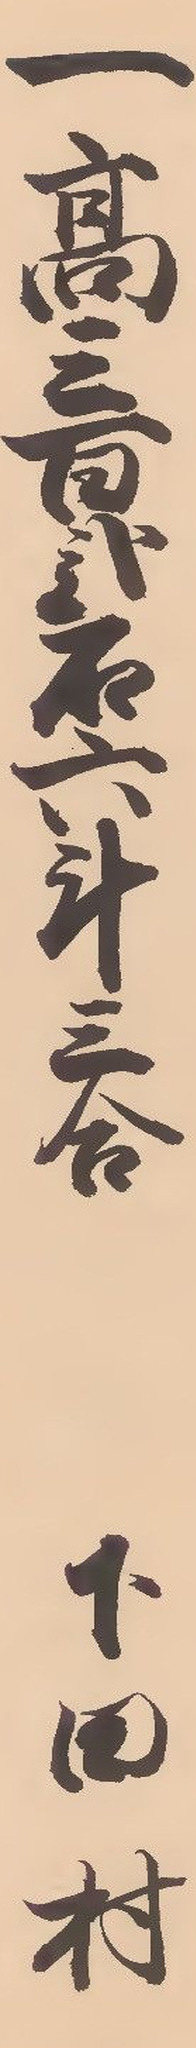一高三百弐石六斗三合下田村
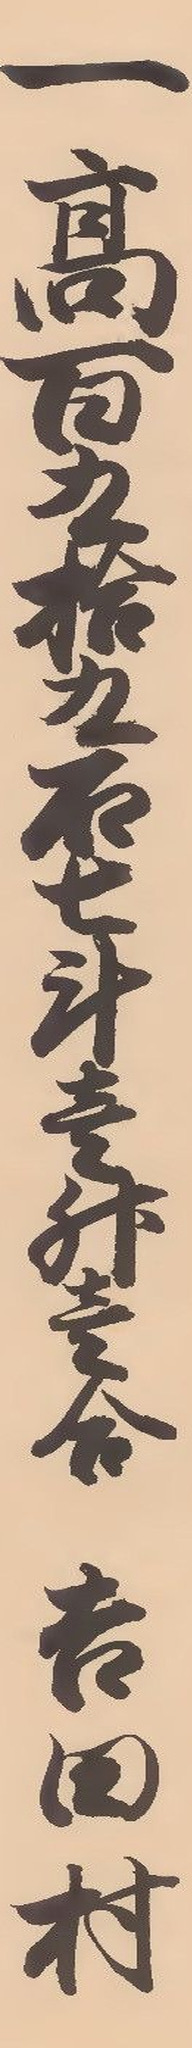一高百九拾九石七斗壱升壱号吉田村
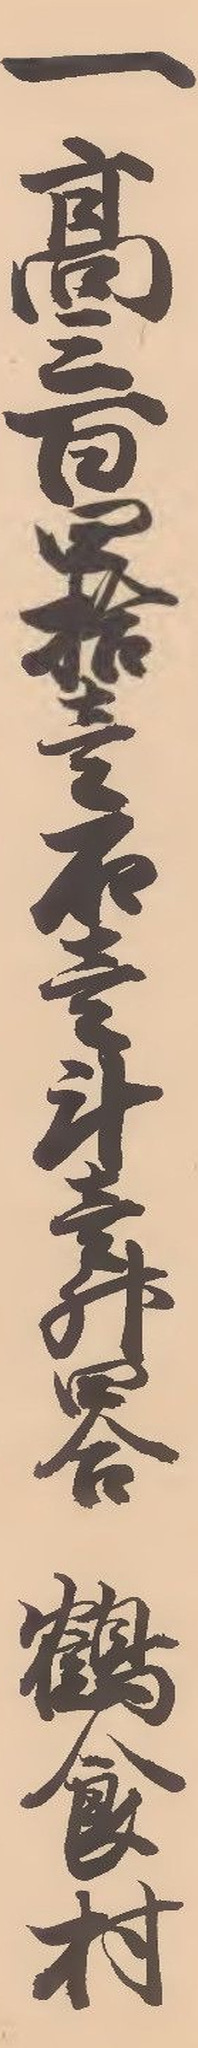一高三百四拾壱石壱斗壱升四合鶴食村
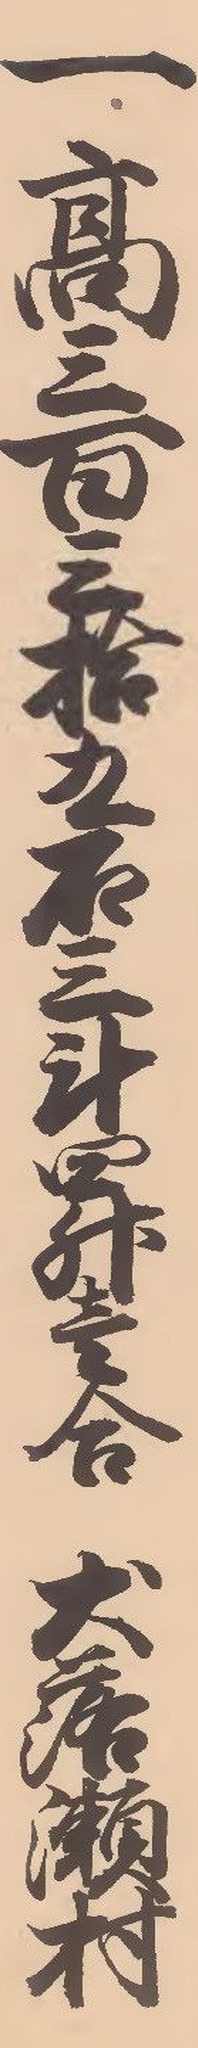一高三百三拾九石三斗四升壱合犬落瀬村
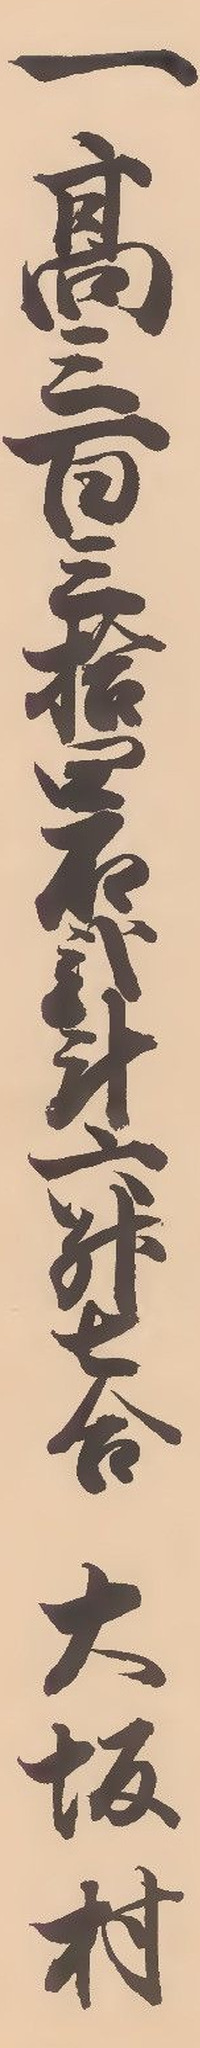一高三百三拾四石弐斗六升七合大坂村

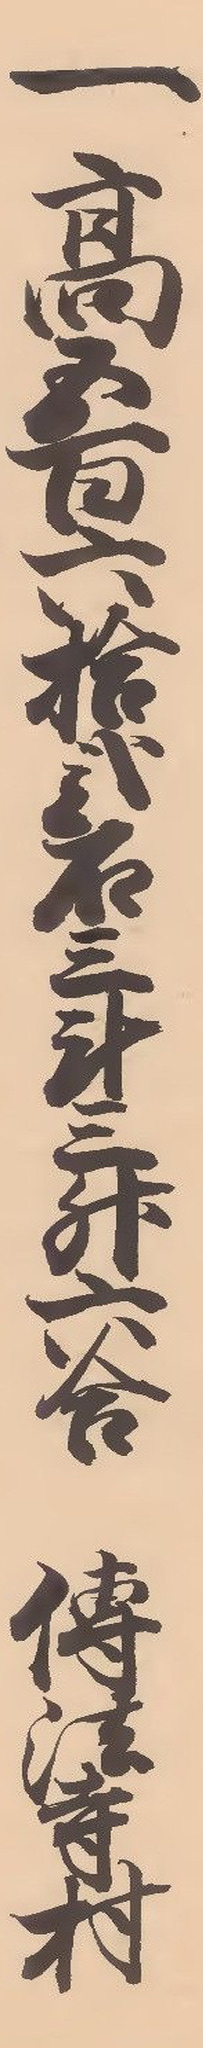一高五百六拾弐石三斗三升六合伝法寺村
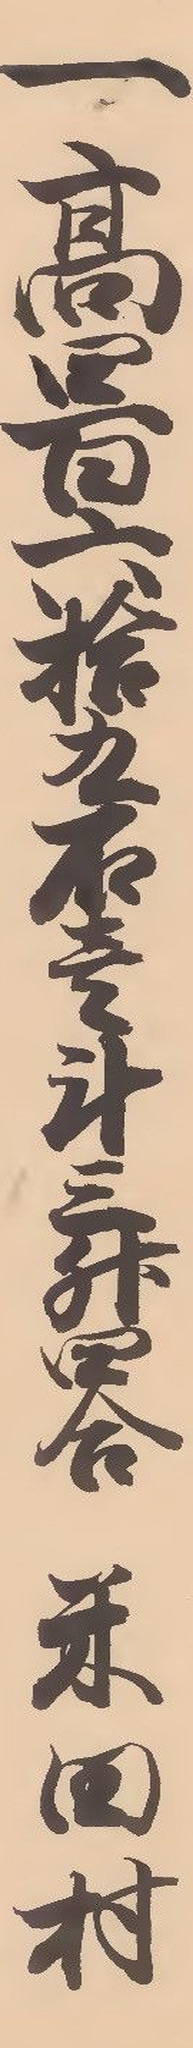一高四百六拾九石壱斗三升四合米田村
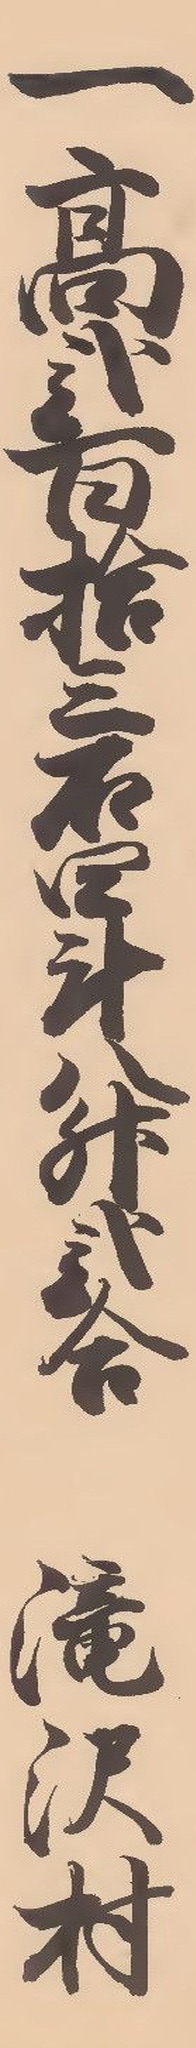一高弐百拾三石四斗八升弐合滝沢村
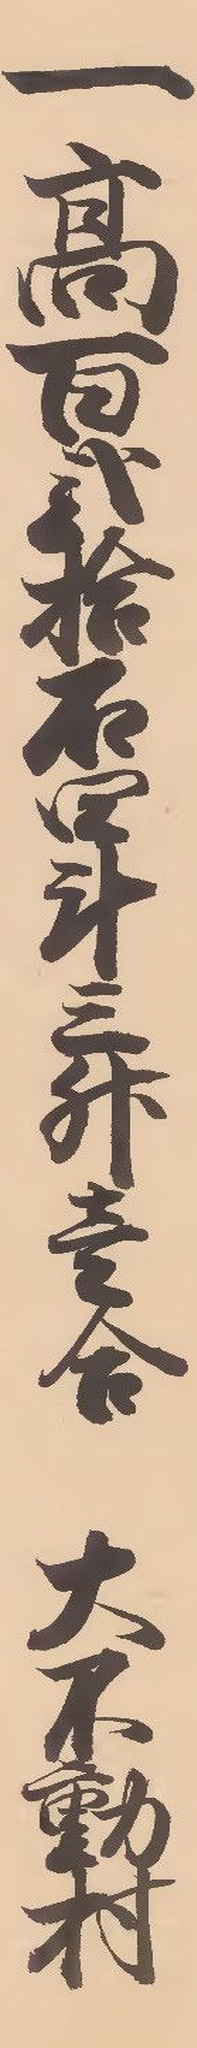一高百弐拾石四斗三升壱合大不動村
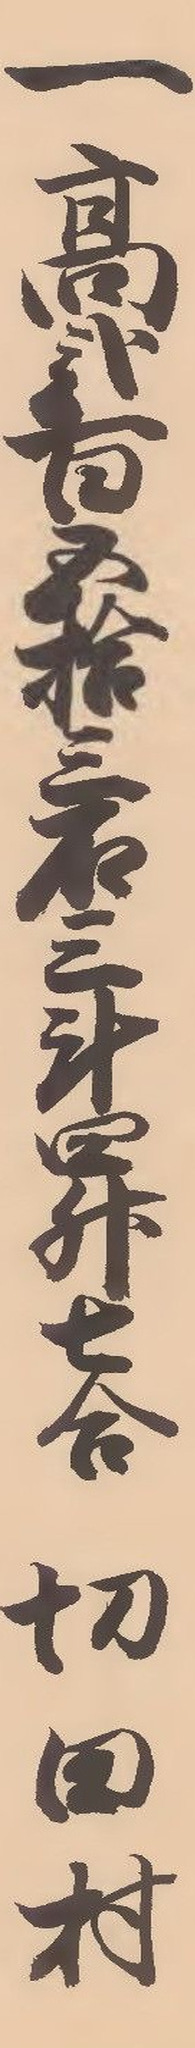一高弐百五拾三石三斗四升七合切田村
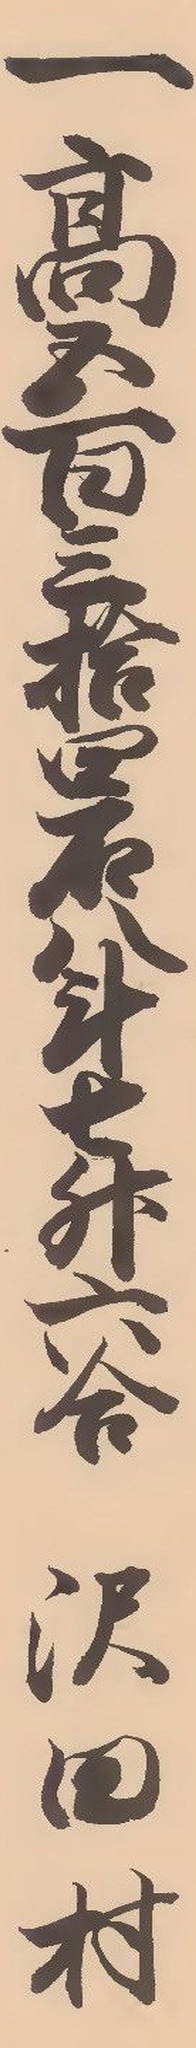一高五百三拾四石八斗七升六合沢田村
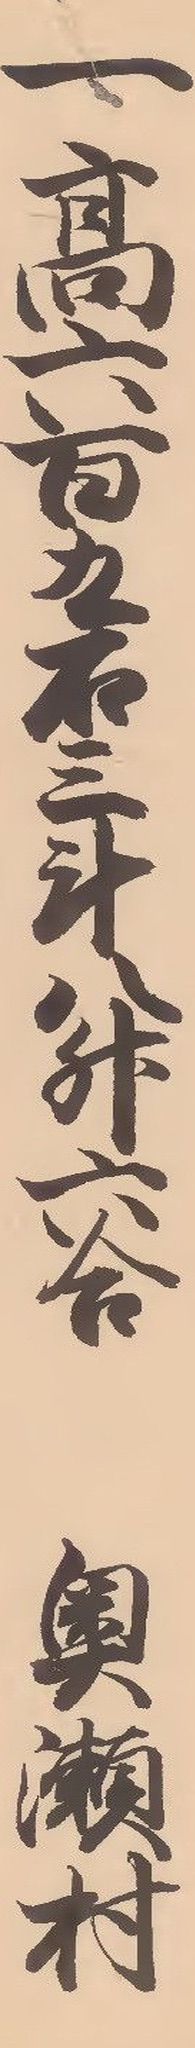一高六百九石三斗八升六合奥瀬村
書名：陸奥国郷帳　６
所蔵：国立公文書館 National Archives of Japan
